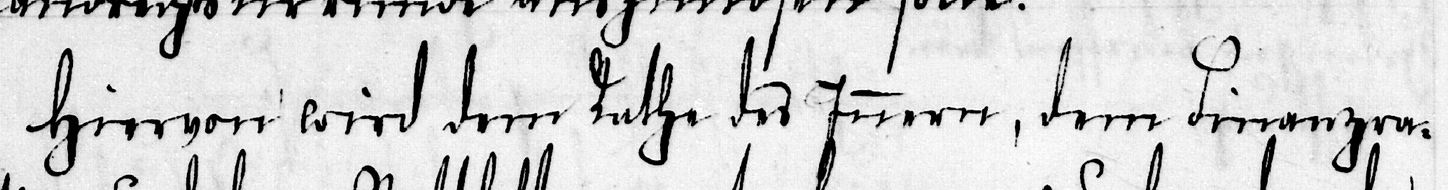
Hiervon wird dem Rathe des Innern, dem Finanzra¬
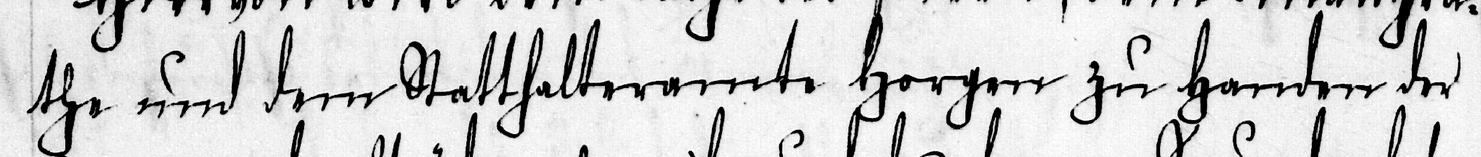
the und dem Statthalteramte Horgen zu Handen der
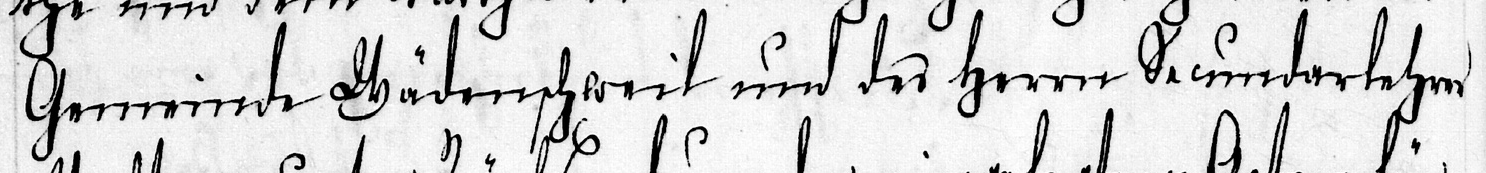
Gemeinde Wädenschweil und des Herrn Secundarlehrer
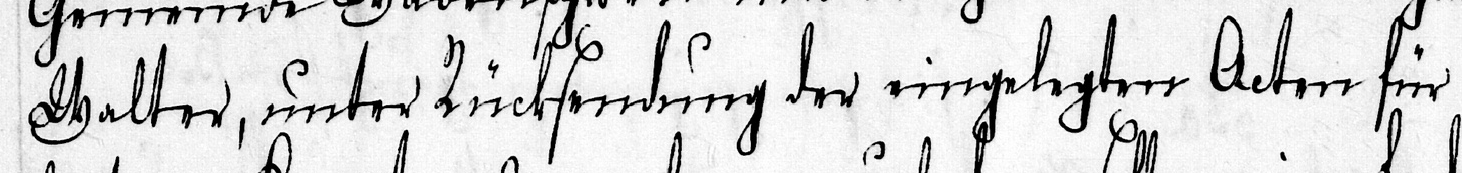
Walter, unter Rücksendung der eingelegten Acten für
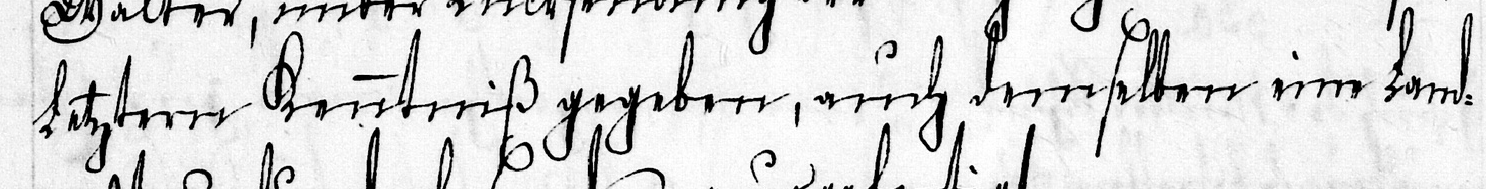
Letztern Kenntniß gegeben, auch demselben eine Land¬
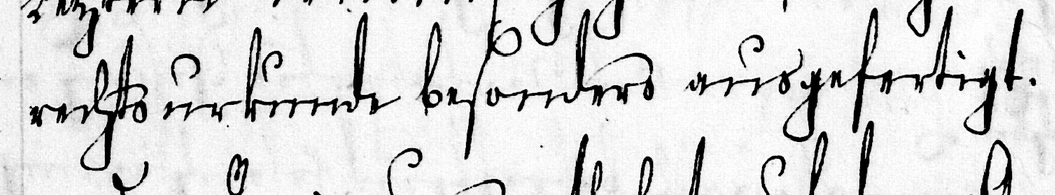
rechtsurkunde besonders ausgefertigt.
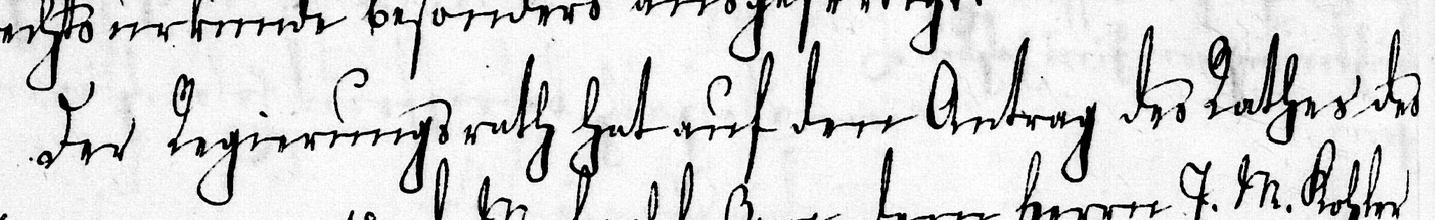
Der Regierungsrath hat auf den Antrag des Rathes des
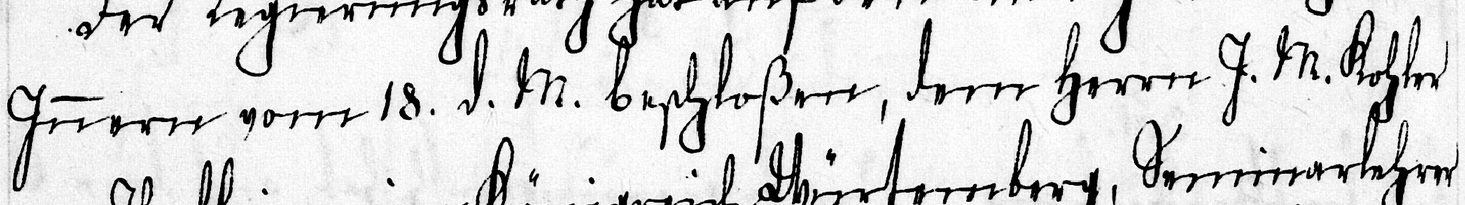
Innern vom 18. d. M. beschloßen, dem Herrn J. M. Kohler
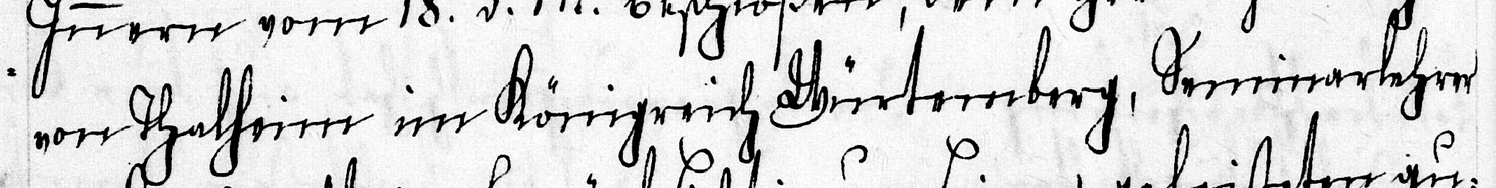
von Thalheim im Königreich Würtemberg, Seminarlehrer
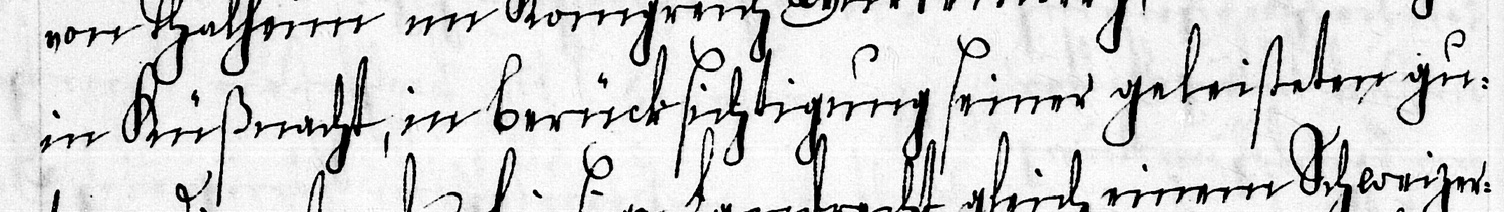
in Küßnacht, in Berücksichtigung seiner geleisteten gu¬
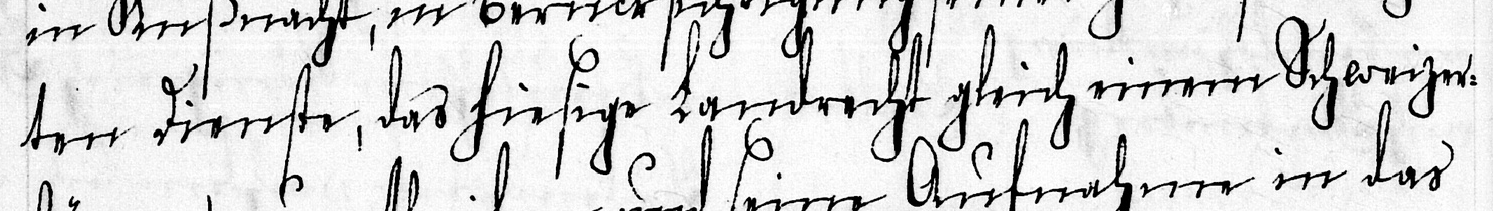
ten Dienste, das hiesige Landrecht gleich einem Schweizer¬
